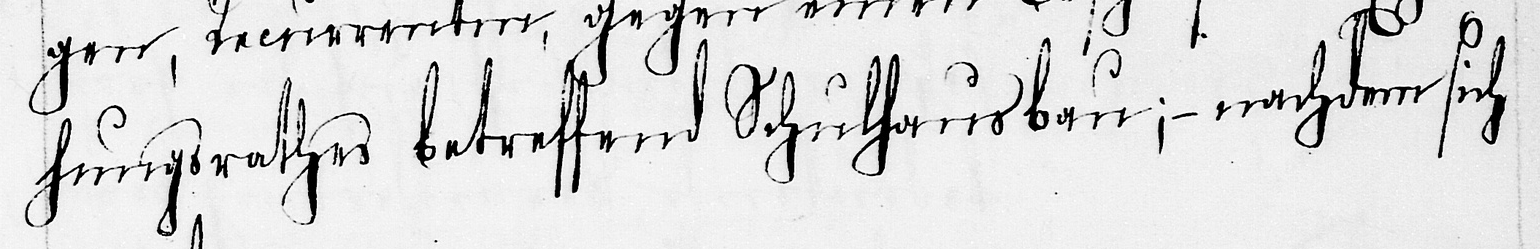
hungsrathes betreffend Schulhausbau; – nachdem sich
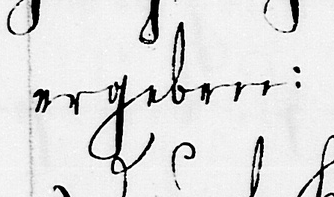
ergeben:
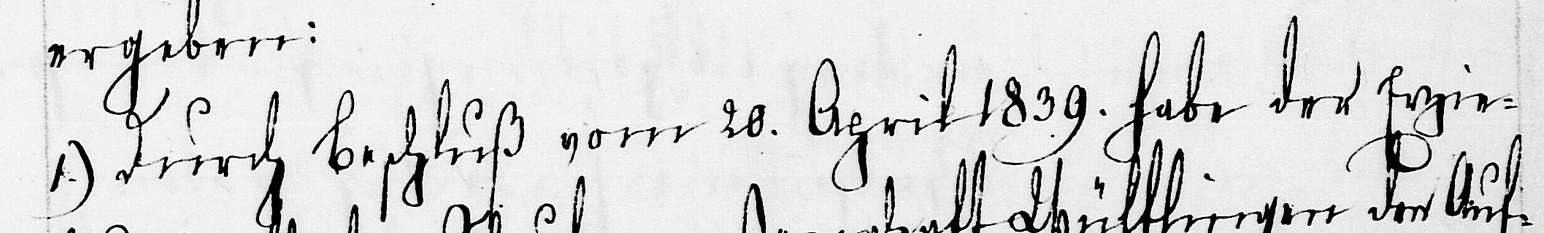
1.) Durch Beschluß vom 20. April 1839. habe der Erzie¬
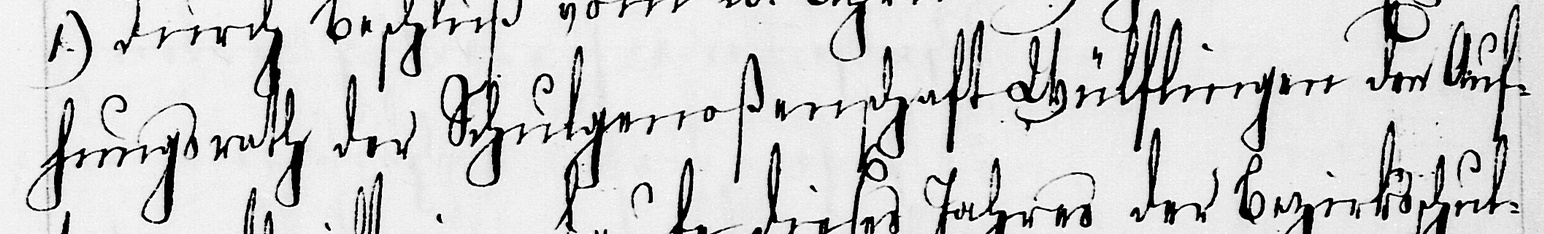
hungsrath der Schulgenoßenschaft Wülflingen den Auf¬
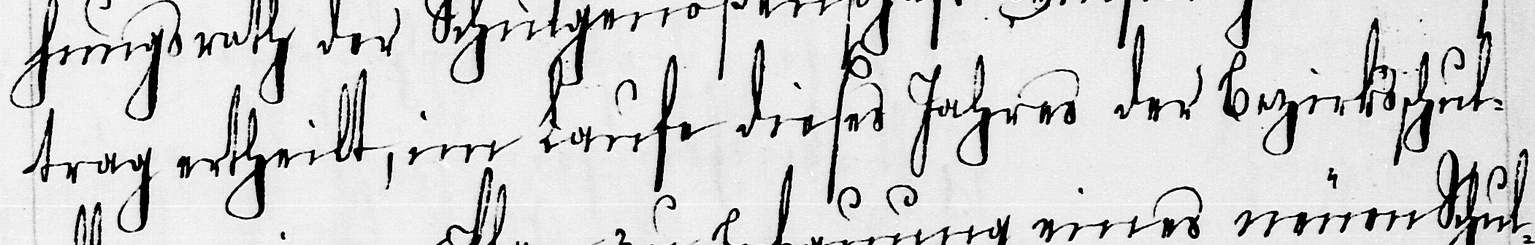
trag ertheilt, im Laufe dieses Jahres der Bezirksschul¬
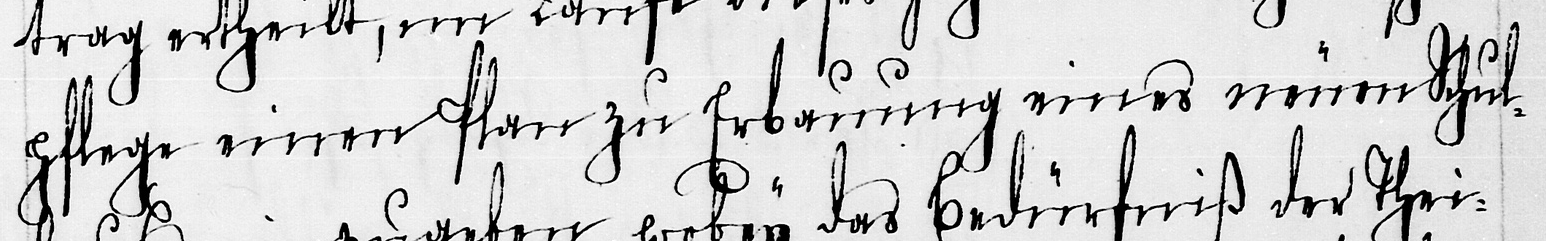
pflege einen Plan zu Erbauung eines neuen Schul¬
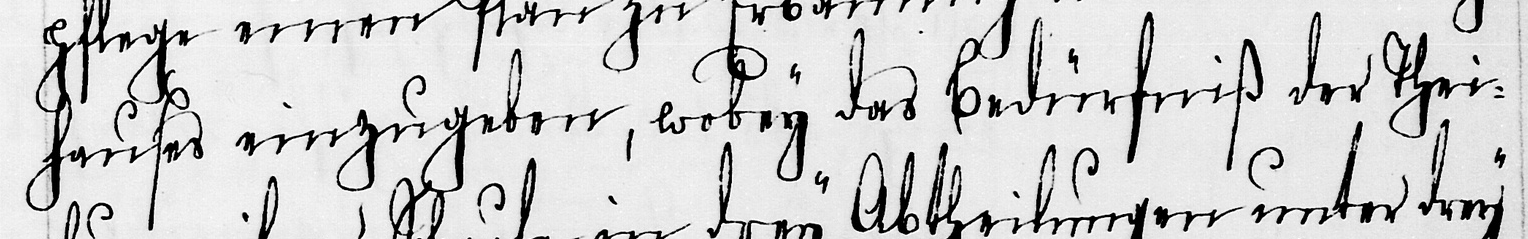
hauses einzugeben, wobey das Bedürfniß der Thei¬
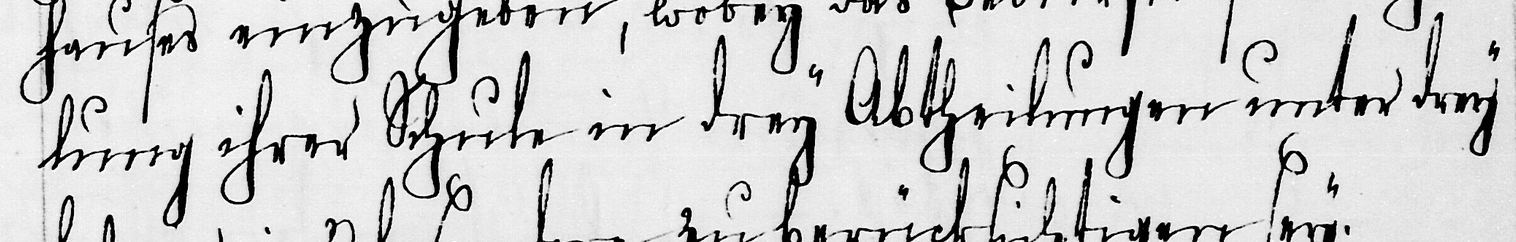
lung ihrer Schule in drey Abtheilungen unter drey
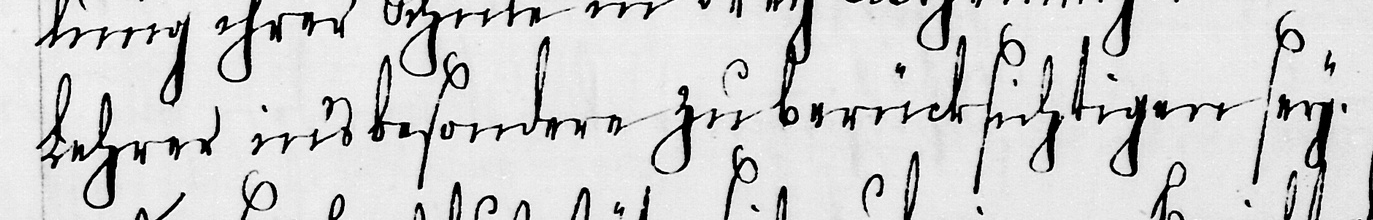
Lehrer in’s besondere zu berücksichtigen sey.
